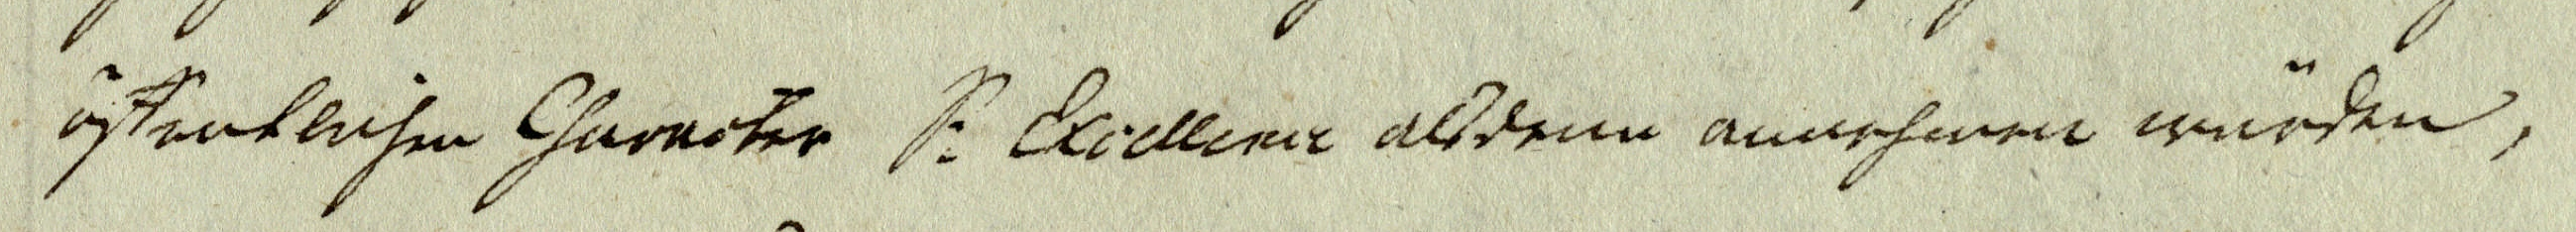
öffentlichen Character Sr Excellence alsdenn annehmen würden,
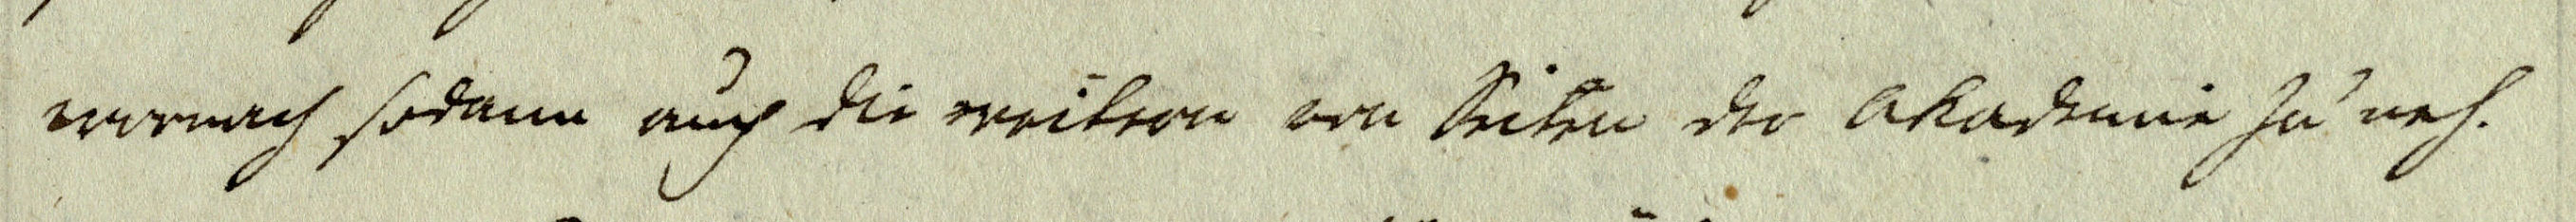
wornach sodann auch die weitern von Seiten der Akademie zu neh¬
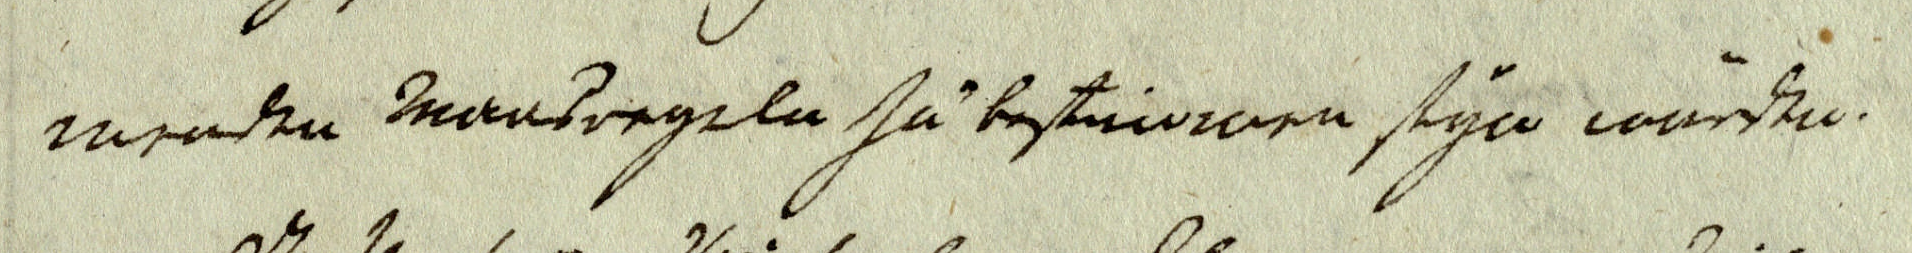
menden Maasregeln zu bestimmen seÿn würden.
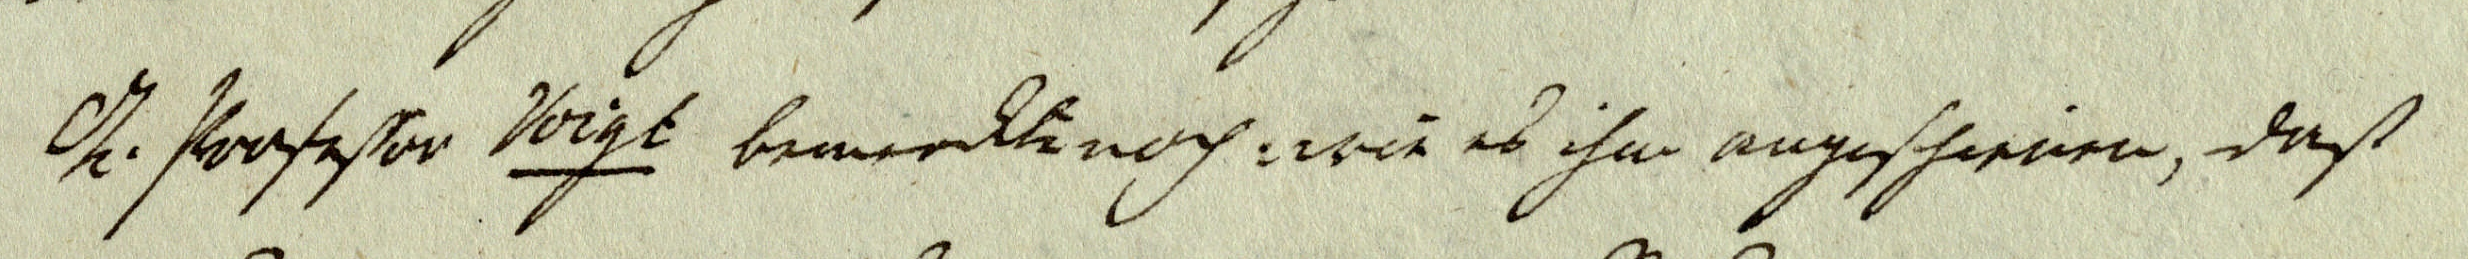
dh. Professor Voigt bemerckte noch wie es ihn angeschienen, daß
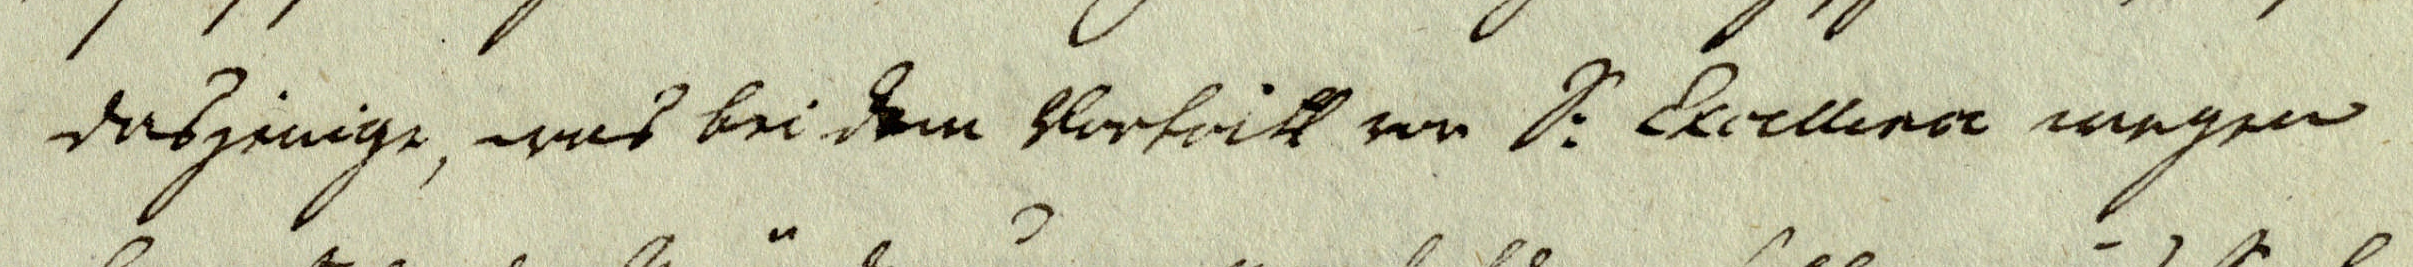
dasjenige, was bei dem Vortritt vor Sr. Excellence wegen
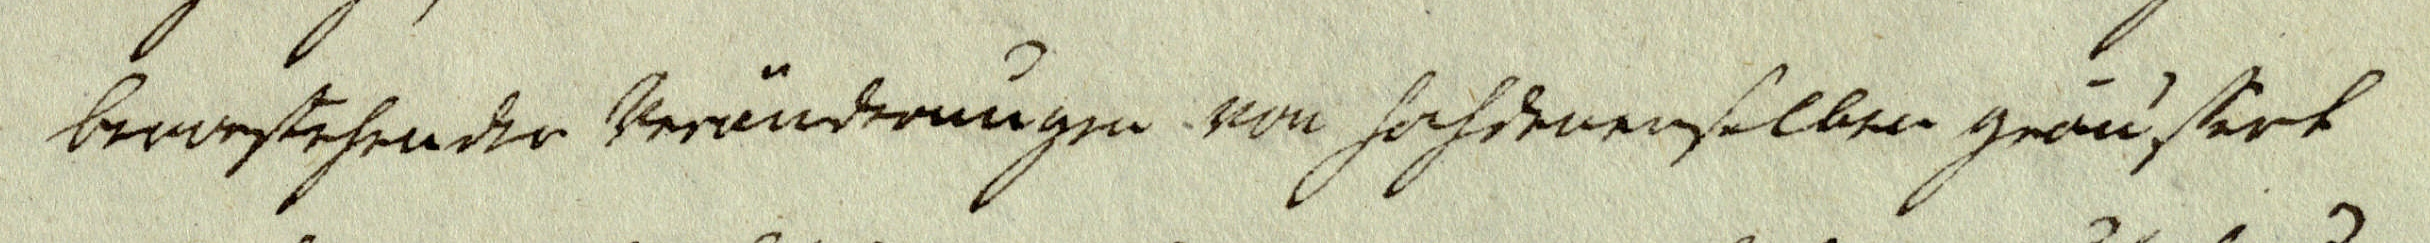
bevorstehender Veränderungen von Hochdenenselben geäussert
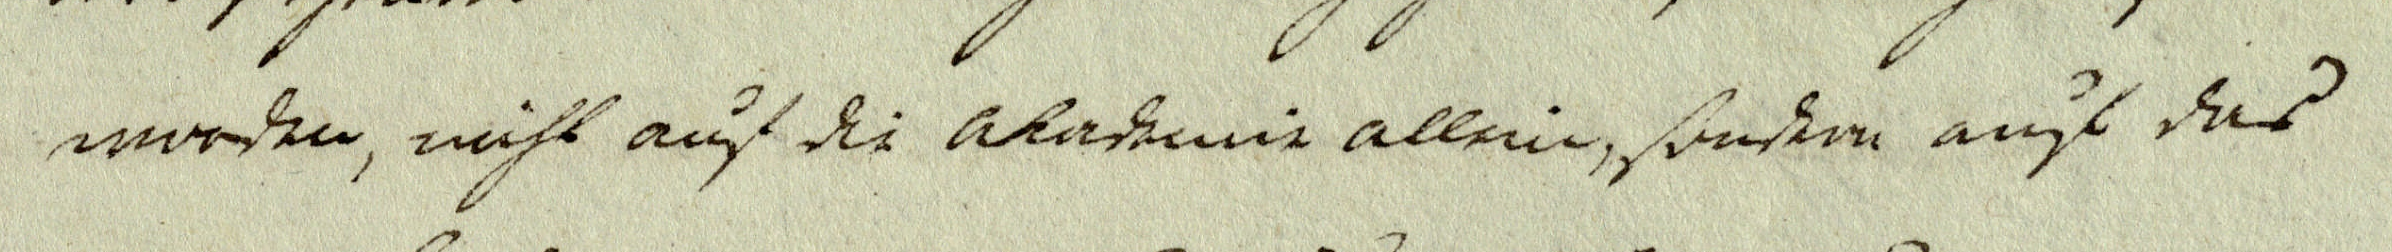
worden, nicht auf die Akademie allein, sondern auf das
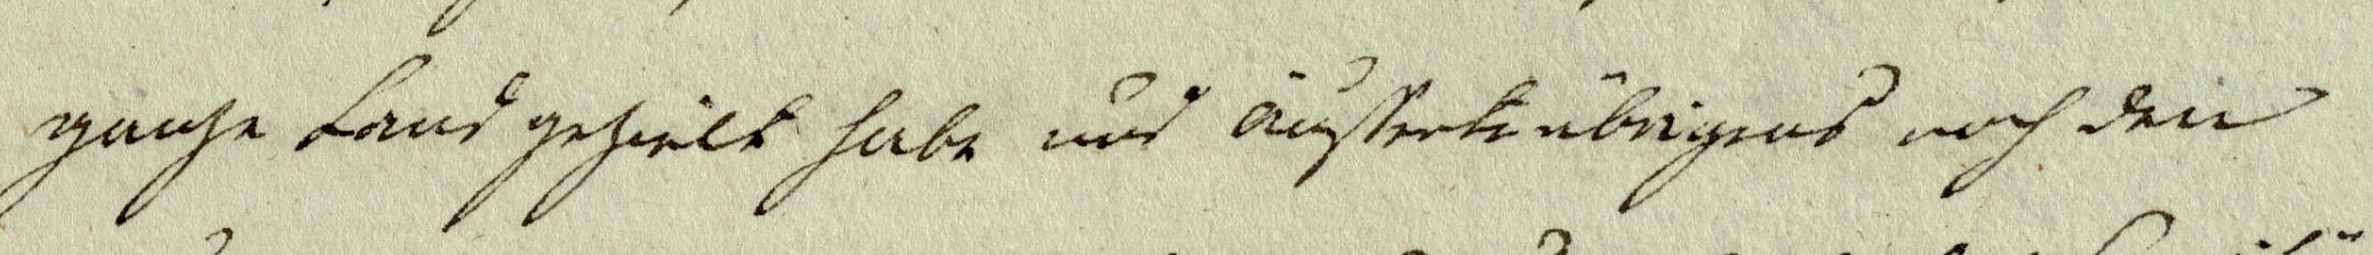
ganze Land gezielt habe und äusserte übrigens noch den
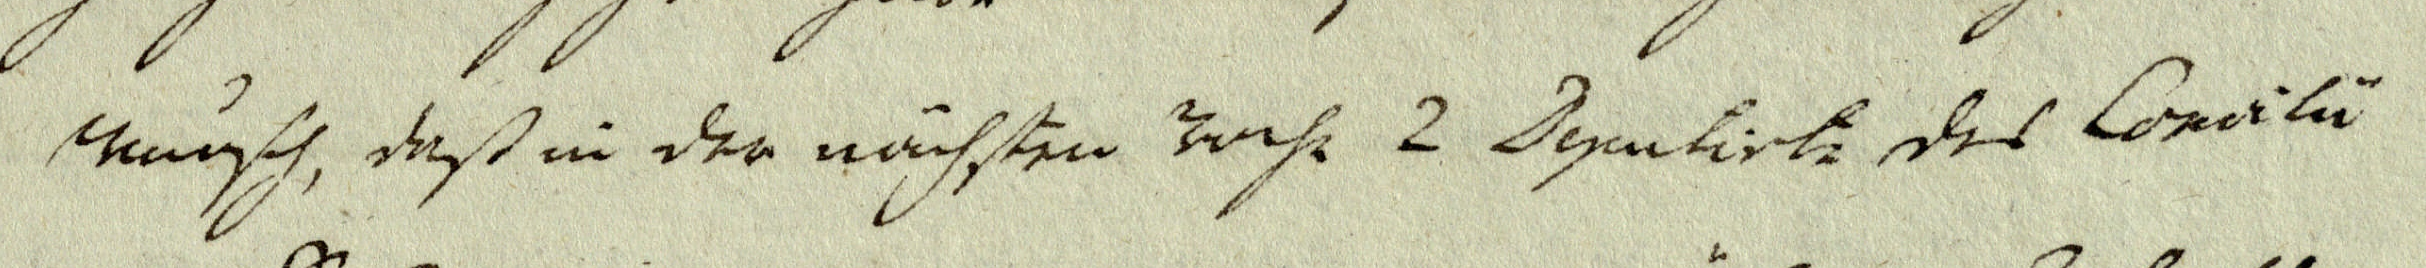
Wunsch, daß in der nächsten Woche 2 Deputirte des Concilii
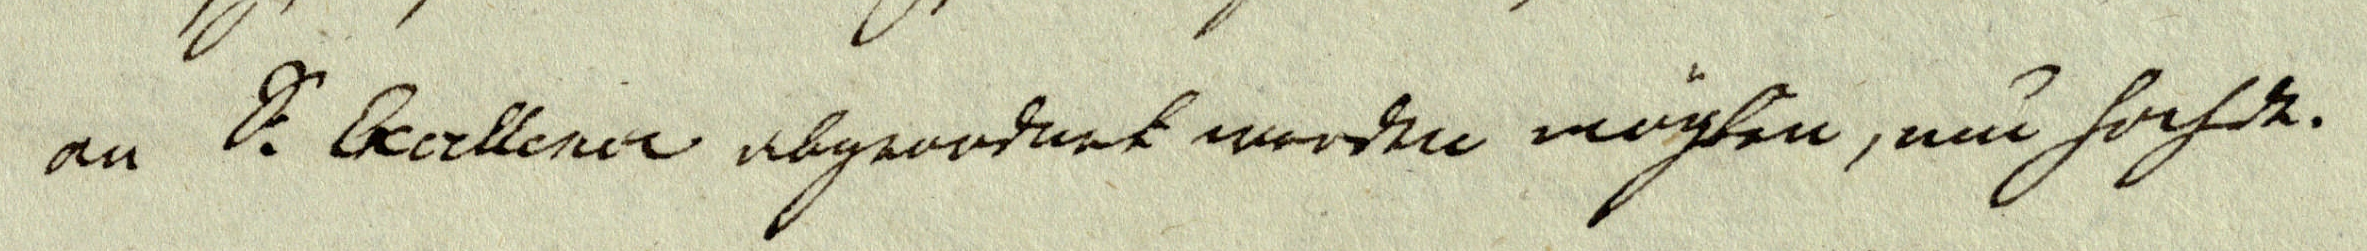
an Sr. Excellence abgeordnet werden mögten, um Hochde¬
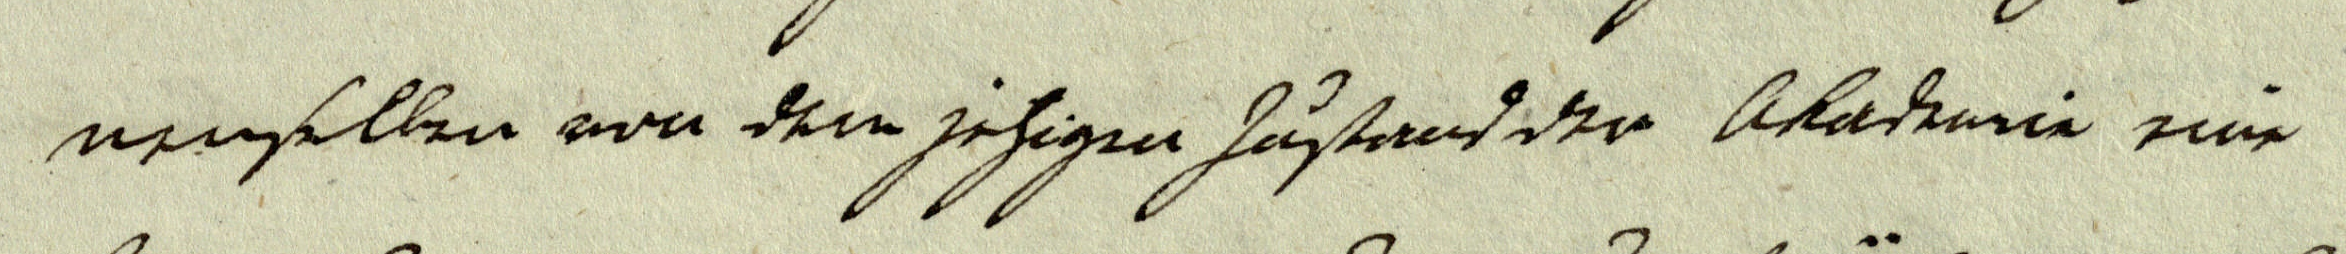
nenselben von dem jetzigen Zustand der Akademie eine
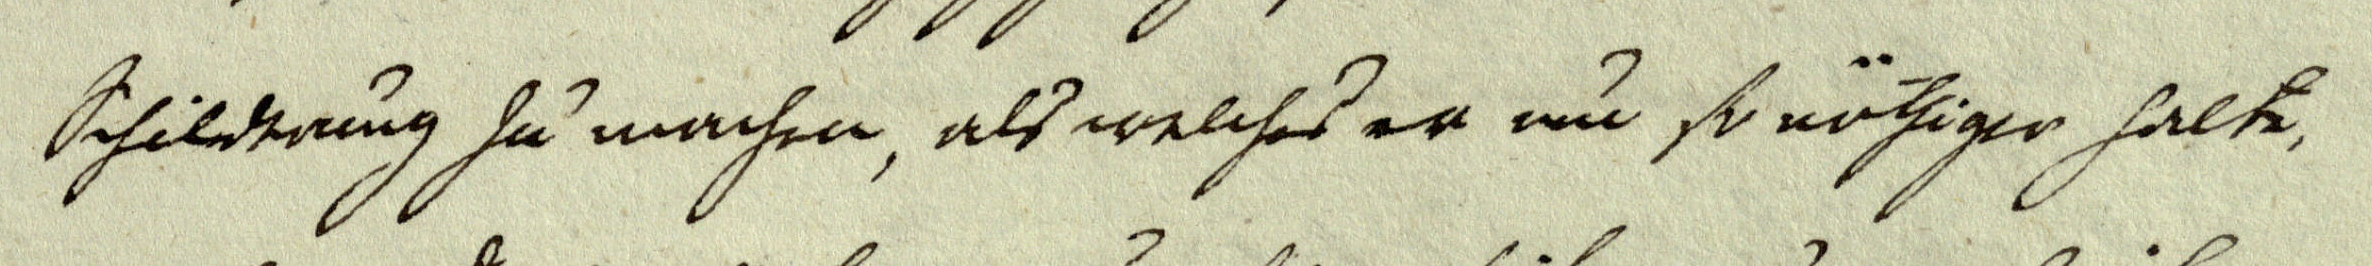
Schilderung zu machen, als welches er um so nöthiger halte,
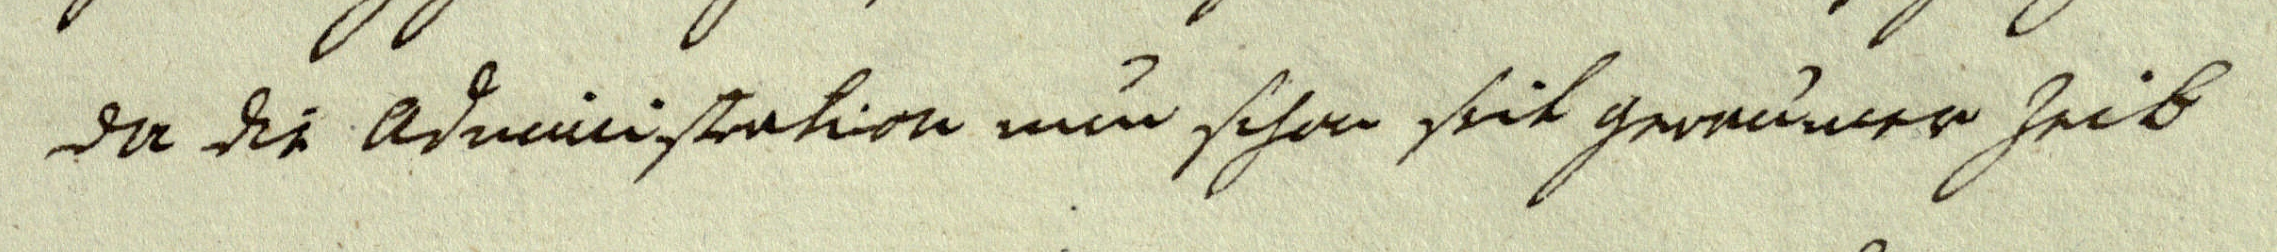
da die Administration nun schon seit geraumer Zeit
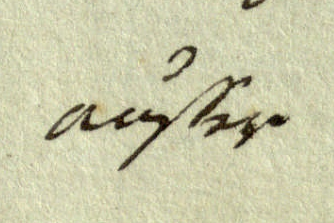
ausser
